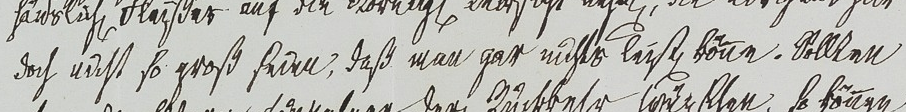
doch nicht so groß seien, daß man gar nichts leisten könne. Sollten
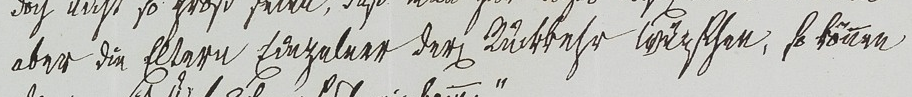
aber die Eltern Einzelner deren Rückkehr wünschen, so können
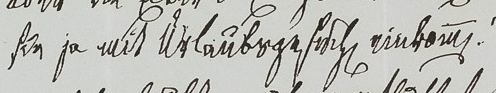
sie ja mit Urlaubsgesuchen einkommen.»
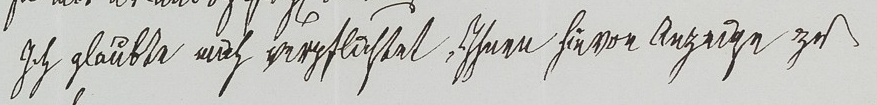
Ich glaubte mich verpflichtet, Ihnen hievon Anzeige zu
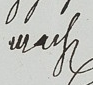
machen.
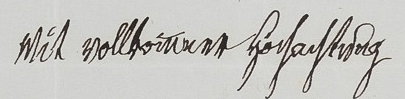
Mit vollkommner Hochachtung
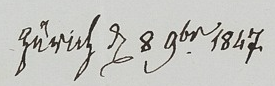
Zürich den 8 9br 1847.
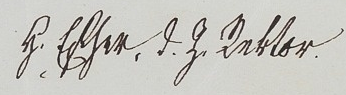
H. Escher, d. Z. Rektor.
